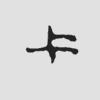上下
